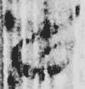㠯（以）
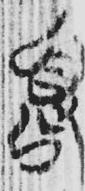頌（容）
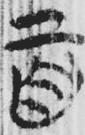百
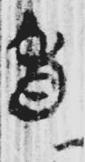眚（姓）
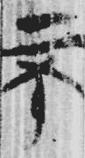不
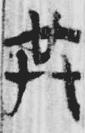共（恭）
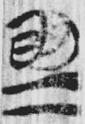則（則）
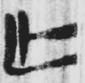亡（無）
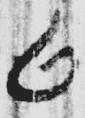㠯（以）
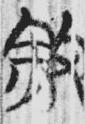敘（除）
